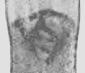百
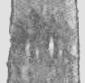卅
